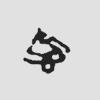德
